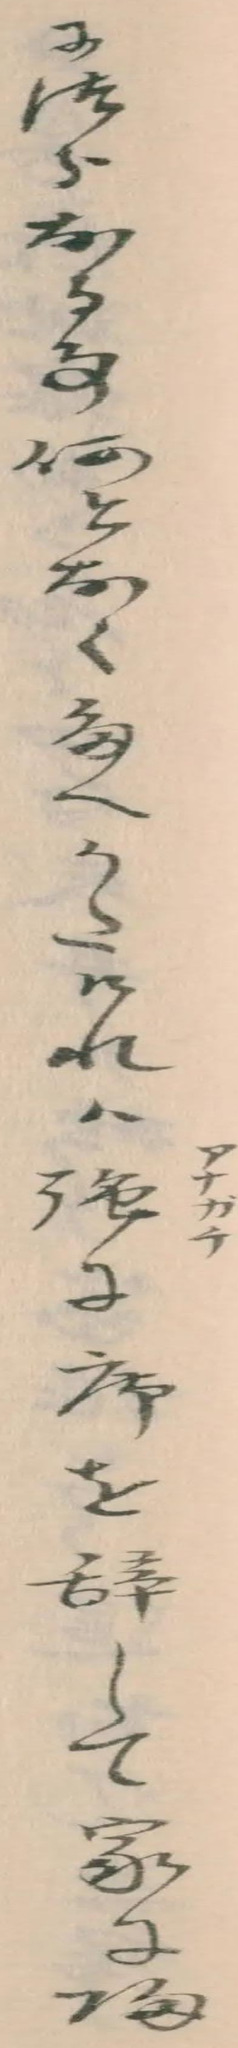につらなる事何となくたへかたけれは強に席を辞して家に帰
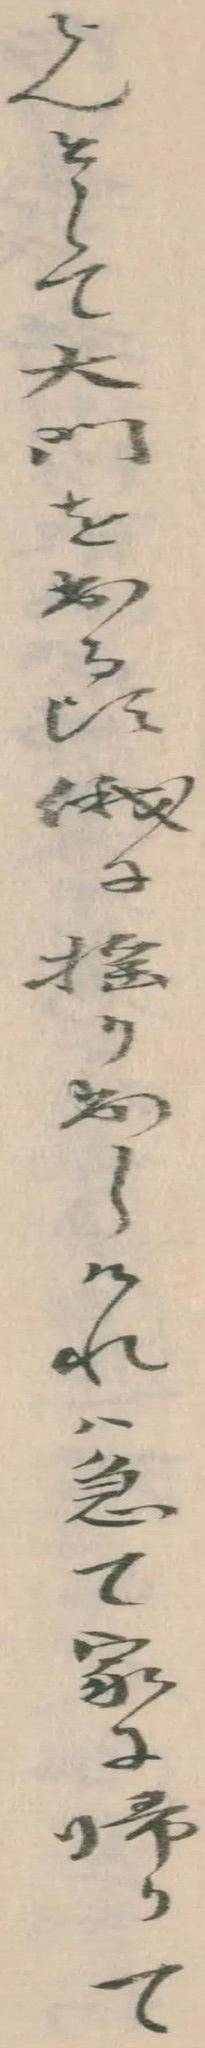らんとして大門を出る頃俄に揺り出しけれは急て家に帰りて
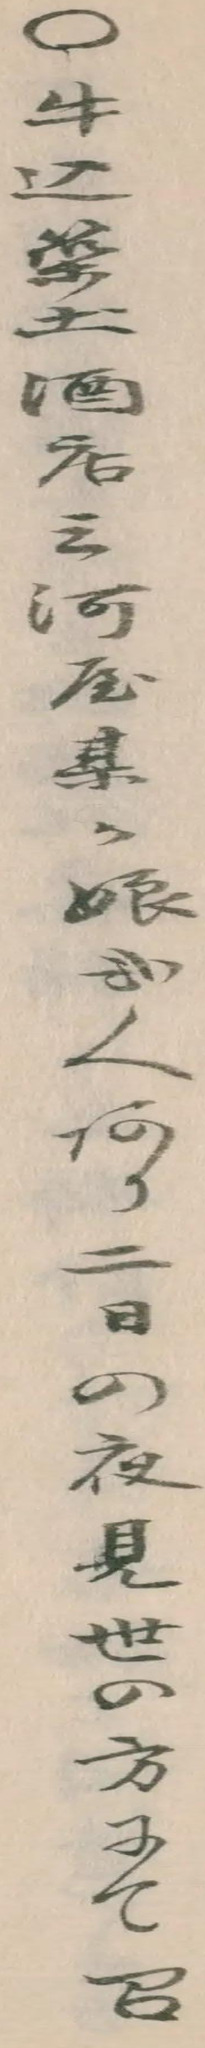〇牛込築土酒店三河屋某か娘弐人あり二日の夜見世の方にて召
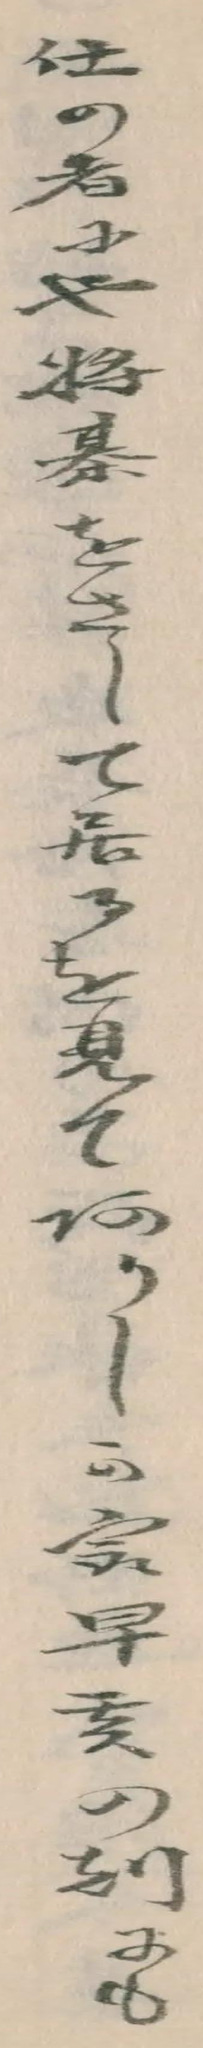仕の者にや将棋をさして居るを見てありしか最早亥の刻にも
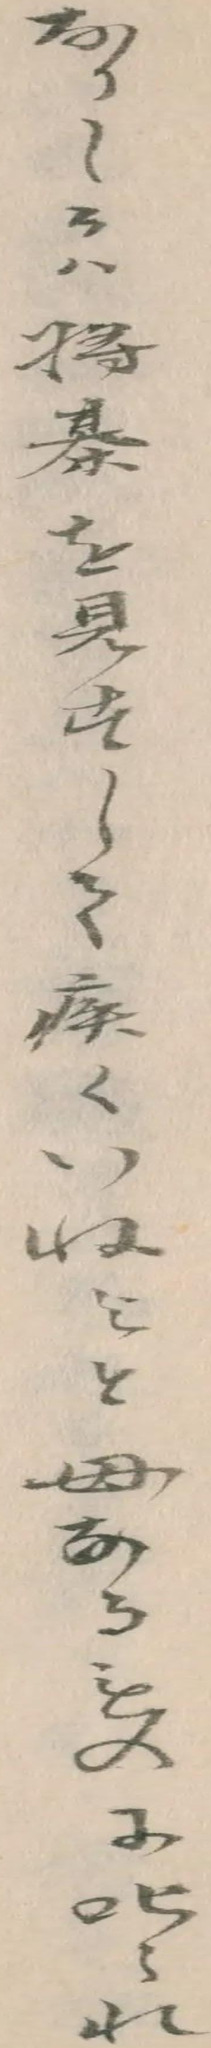なりしかは将棋を見すして疾くいねよと母なるものに叱られ
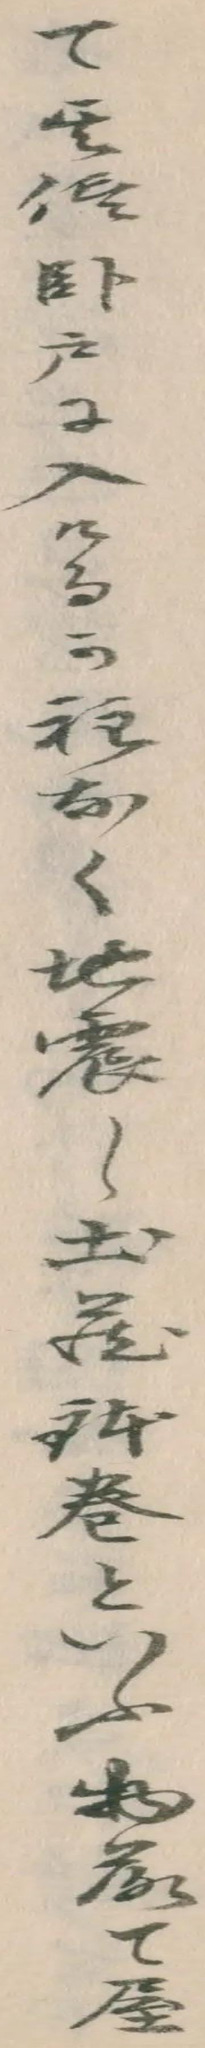て其侭臥戸に入けるか程なく地震し土蔵鉢巻といふ物落て屋
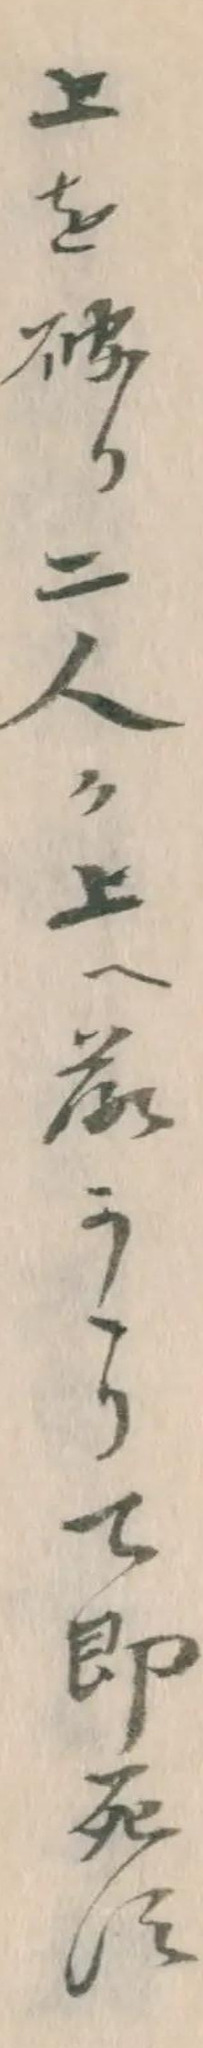上を破り二人か上へ落かゝりて即死す
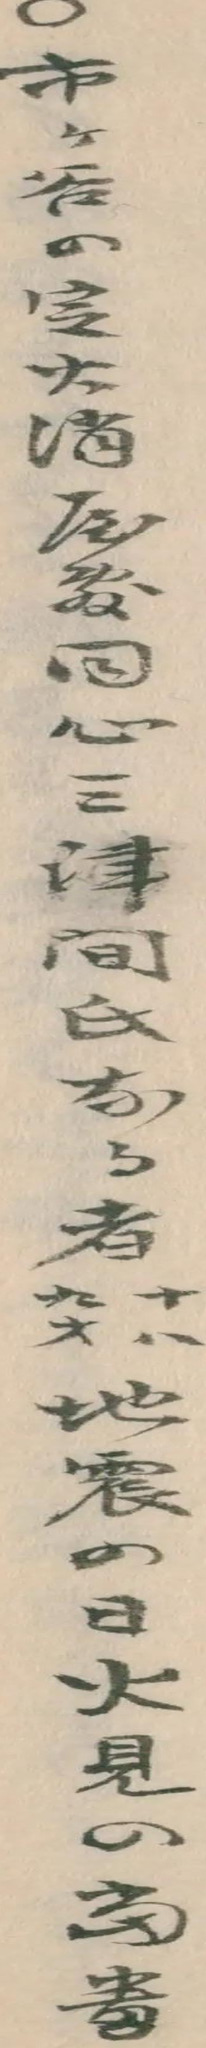〇市ヶ谷の定火消屋敷同心三津間氏なる者十八九才地震の日火見の当番

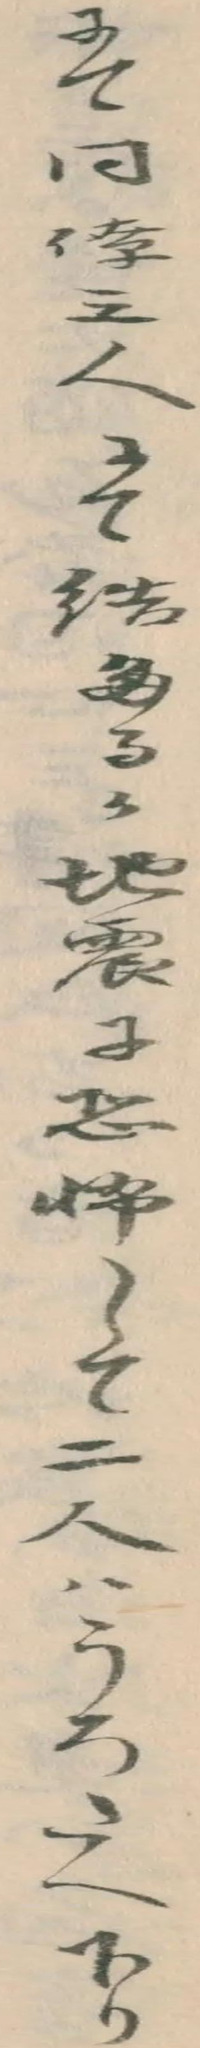にて同僚三人にて結たるか地震に恐怖して二人はうろたへ下り
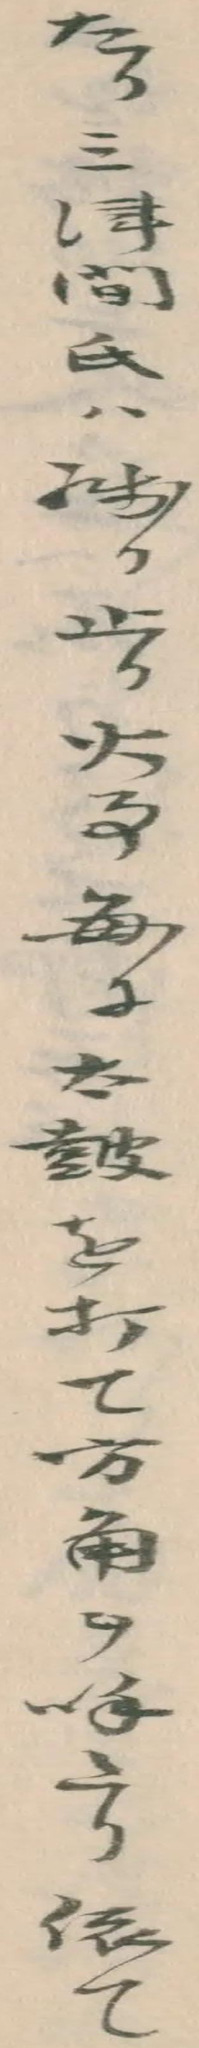たり三津間氏は残り止り火事毎に太鼓を打て方角ヲ呼たり依て
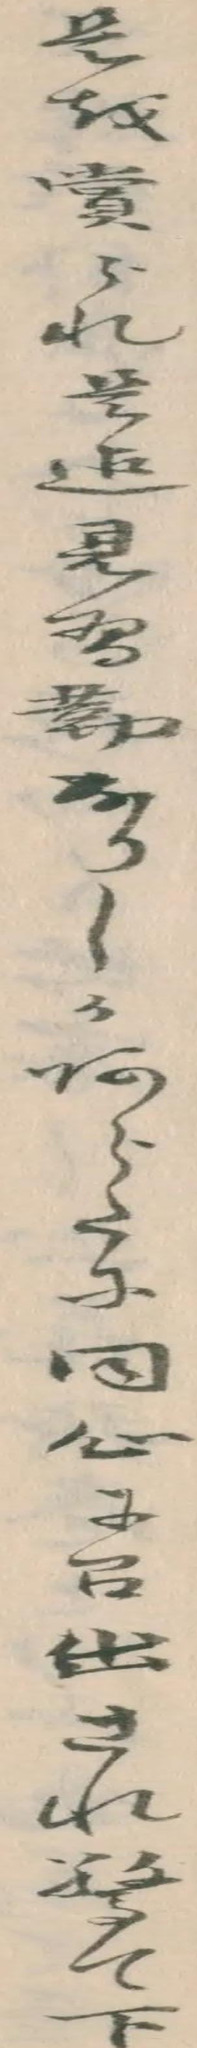是を賞られ是迄見習勤なりしかあらたに同心に召出され驚きて下
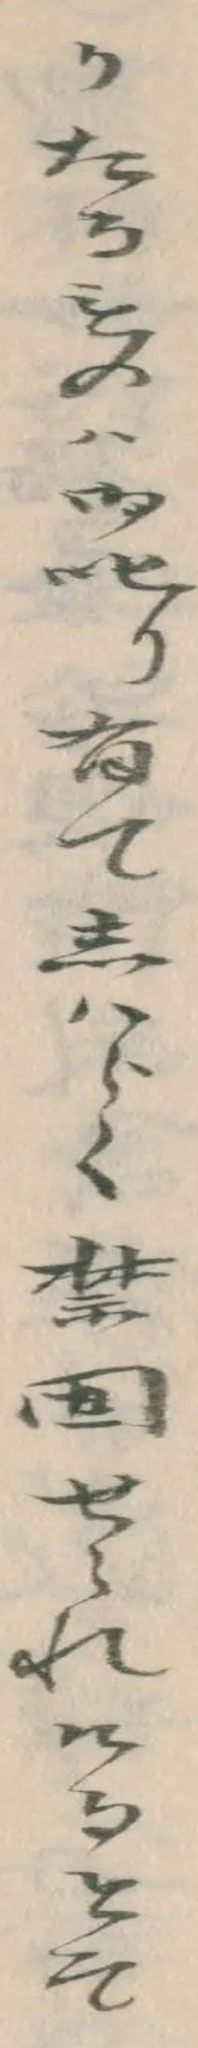りたるものは御叱り有てしはらく禁固せられけるとそ
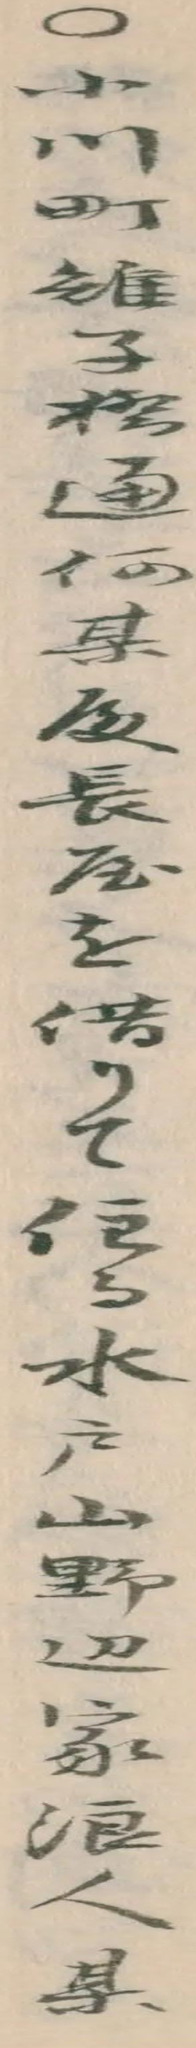〇小川町雉子橋通何某殿長屋を借りて住る水戸山野辺家浪人某
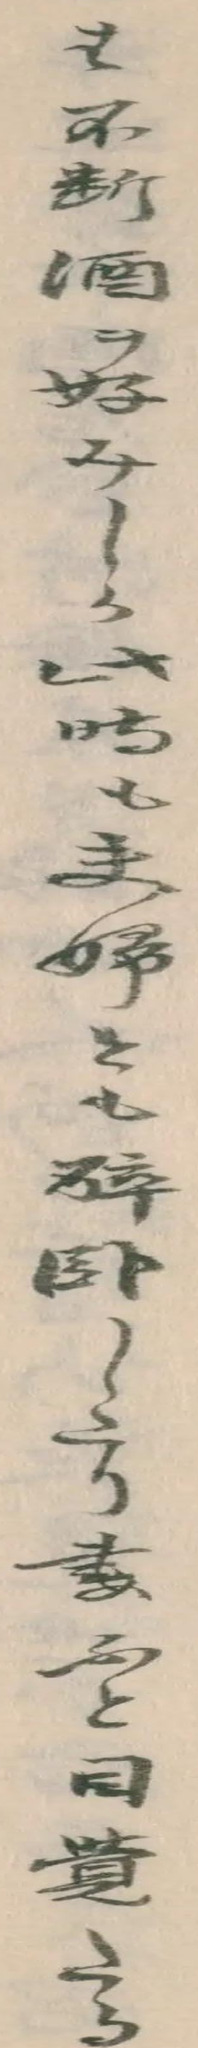は不断酒ヲ好みしか此時も夫婦とも酔臥したり妻ふと目覚たる
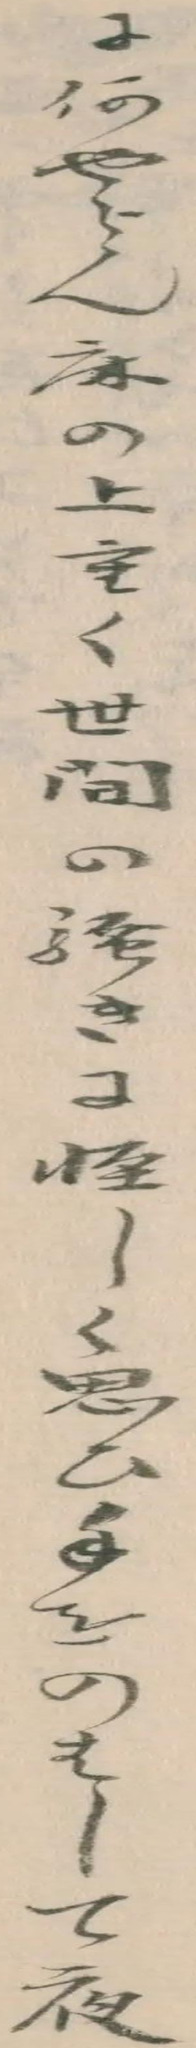に何やらん床の上重く世間の騒きに怪しく思ひ手をのはして夜
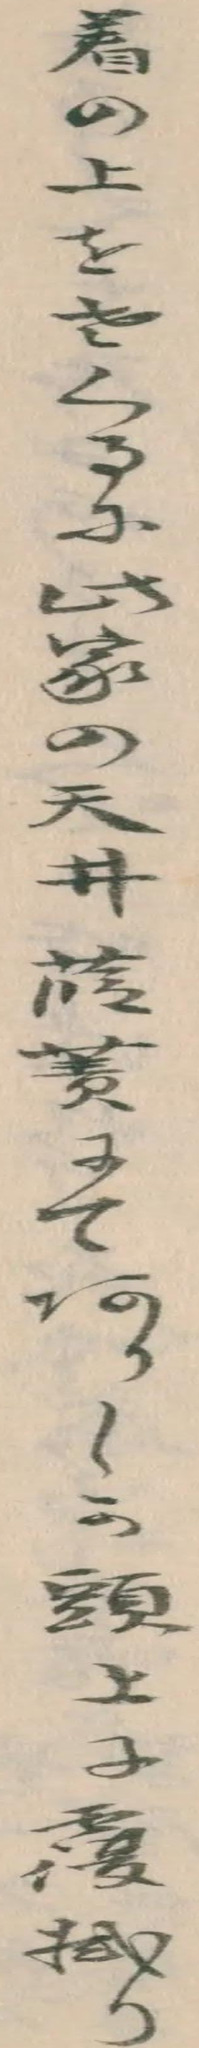着の上をさくるに此家の天井葭簀にてありしか頭上に覆拭り
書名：地災撮要. 巻7-9(地震之部)
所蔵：国立国会図書館 National Diet Library, JAPAN
